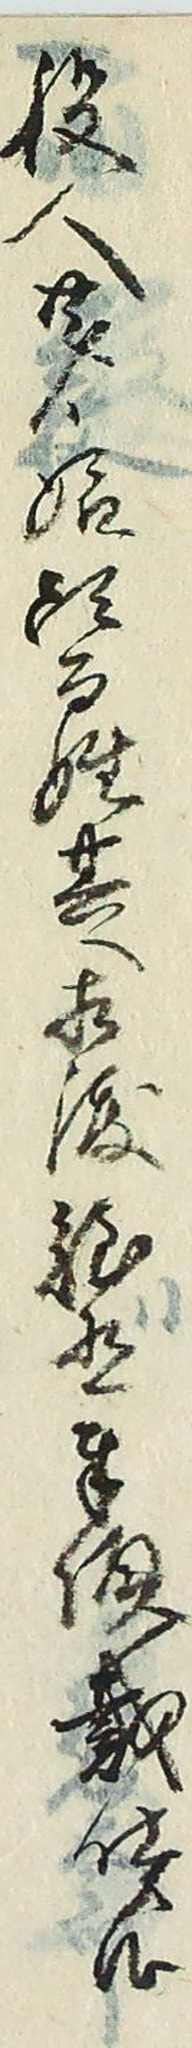役人共ゟ始頭百姓共へ相渡難有奉頂戴仕候
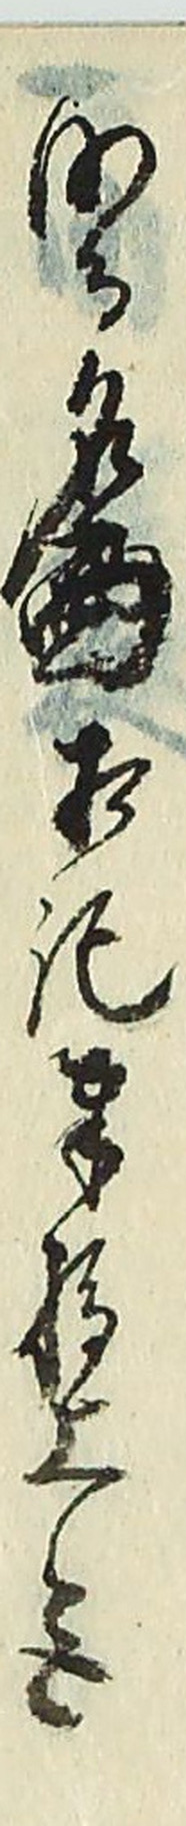仍而名面相記奉指上候以上
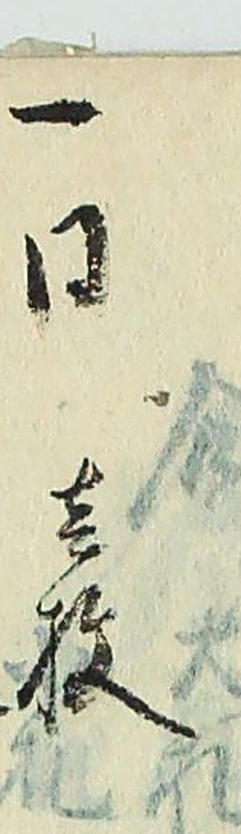一同壱枚同
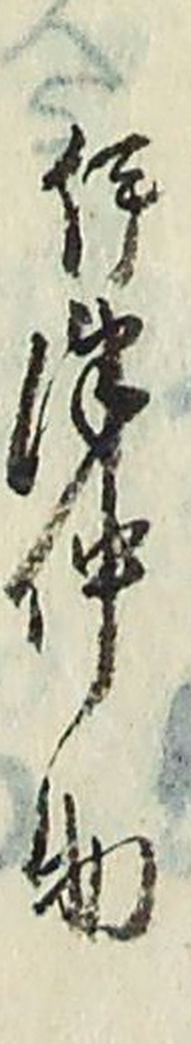伊澤仲助
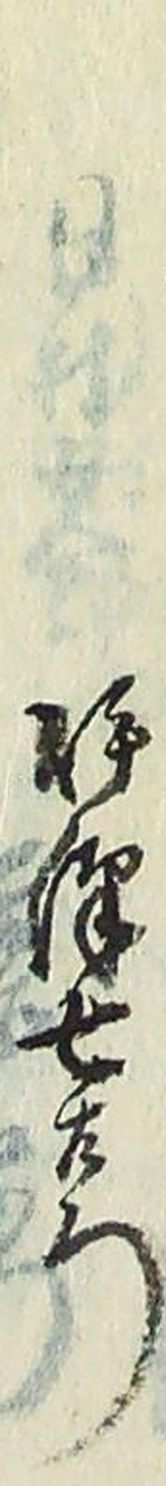伊澤七左衛門
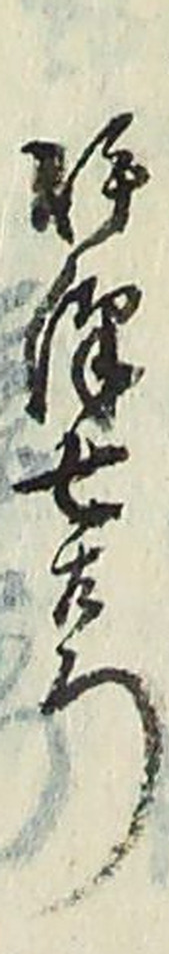伊澤七左衛門
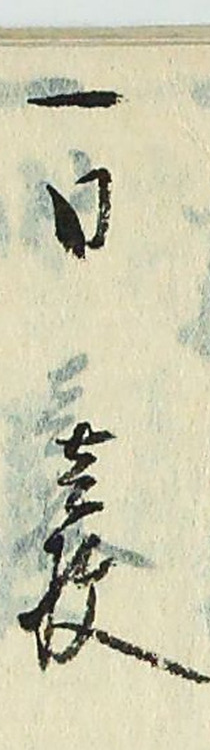一同壱枚同
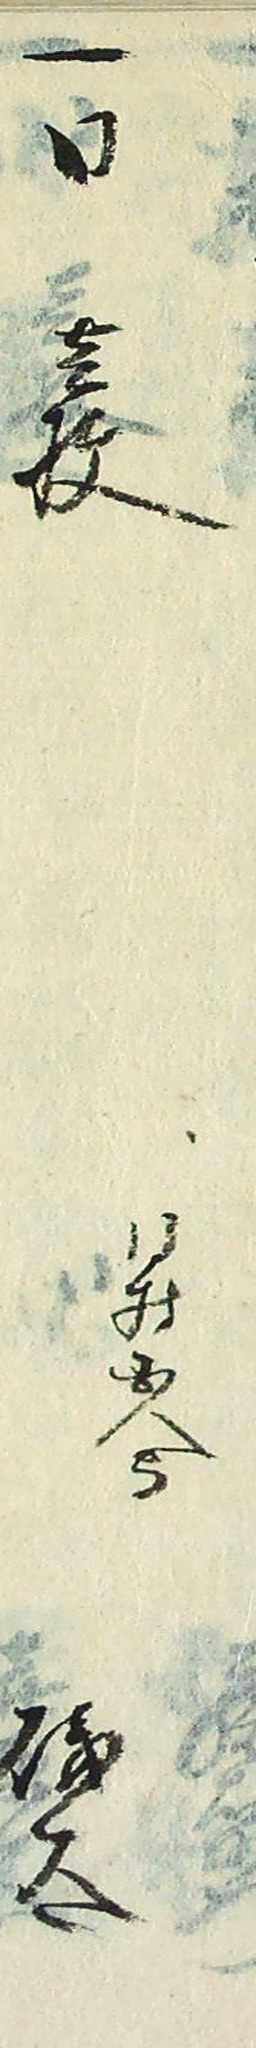一同壱枚同村五人与
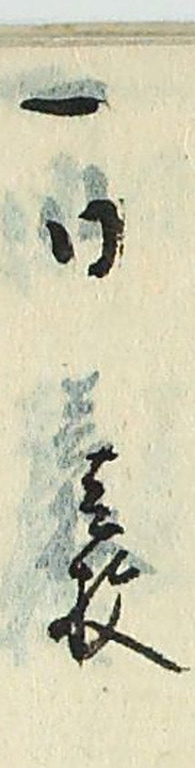一同壱枚同
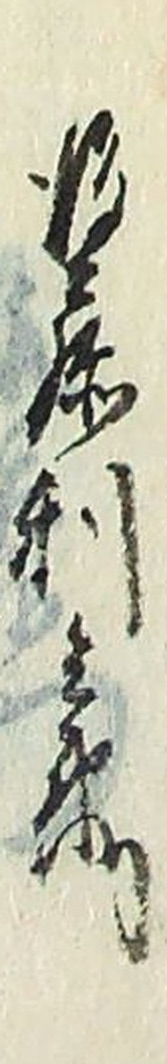後藤利兵衛
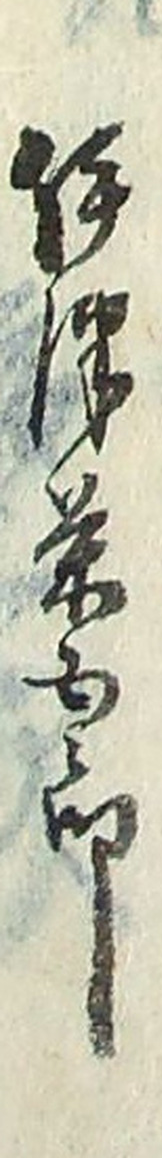伊澤栄五郎
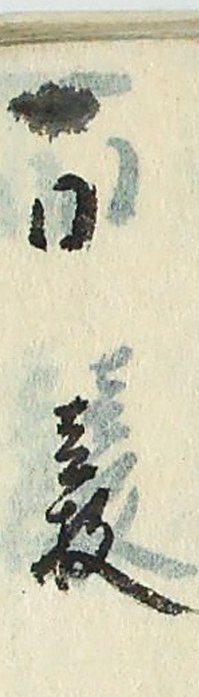一同壱枚同
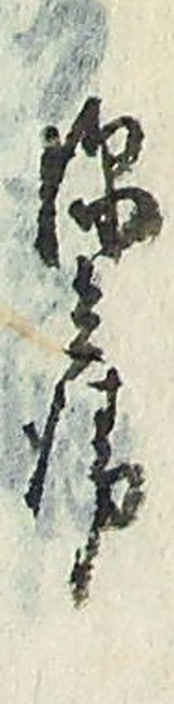源兵衛

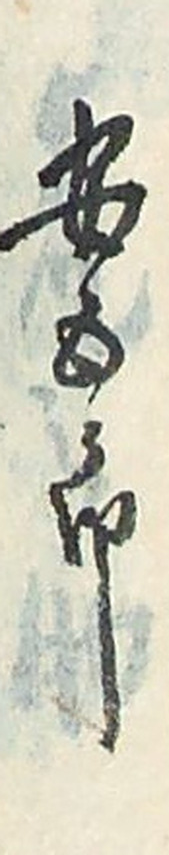安五郎
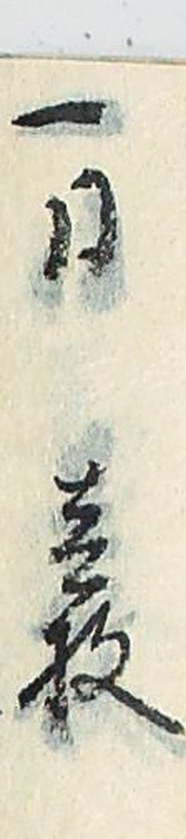一同壱枚同
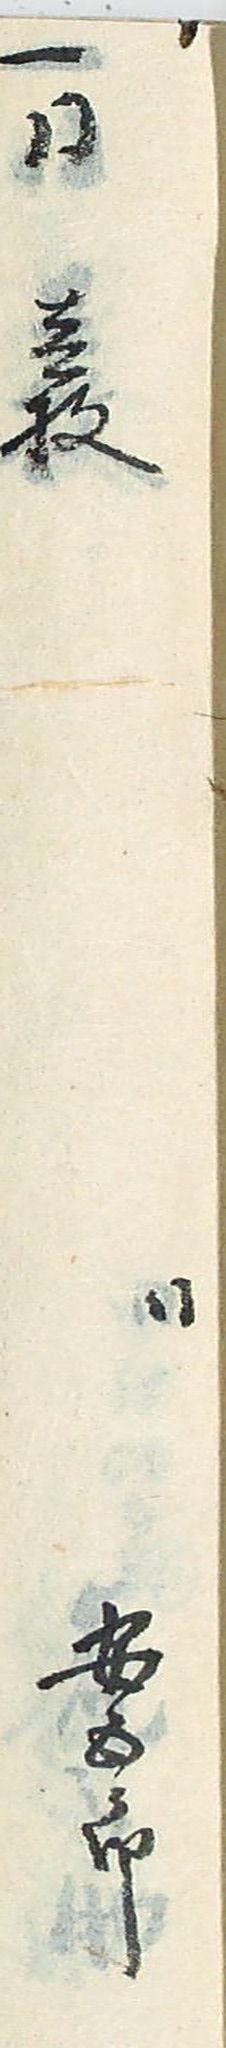一同壱枚同村五人与
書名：諸御用御□受書控
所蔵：鳴門教育大学 Naruto University of Education
